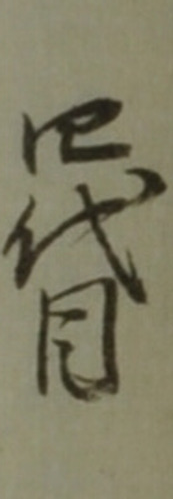四代目
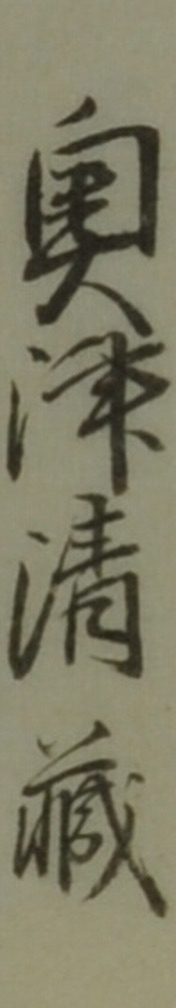奥津清蔵
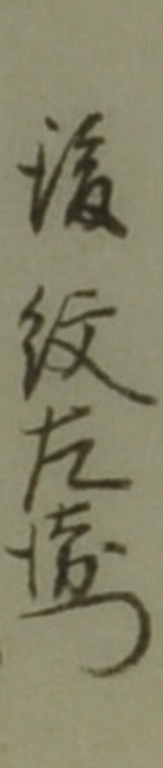後紋左衛門
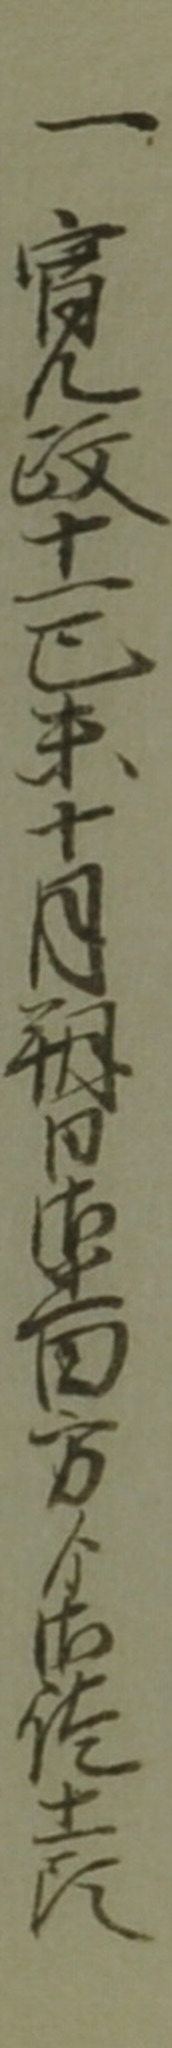一寛政十一己未十月朔日御番方ゟ御徒士頭
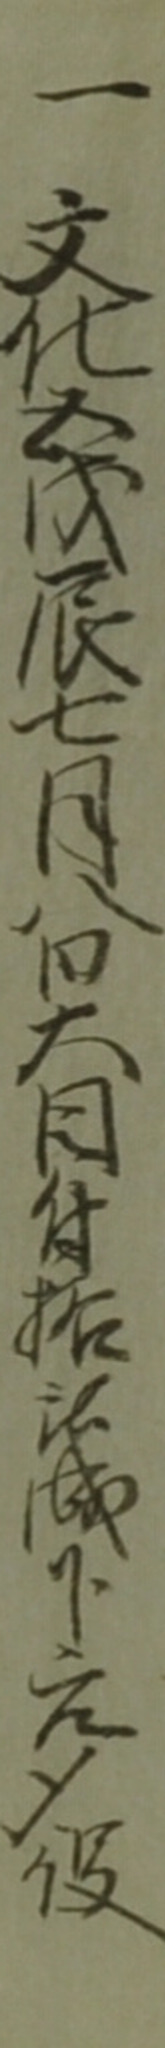一文化五戊辰七月八日大目付格被成下元〆役
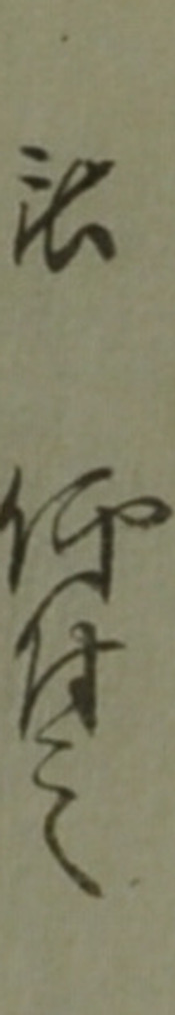被仰付之
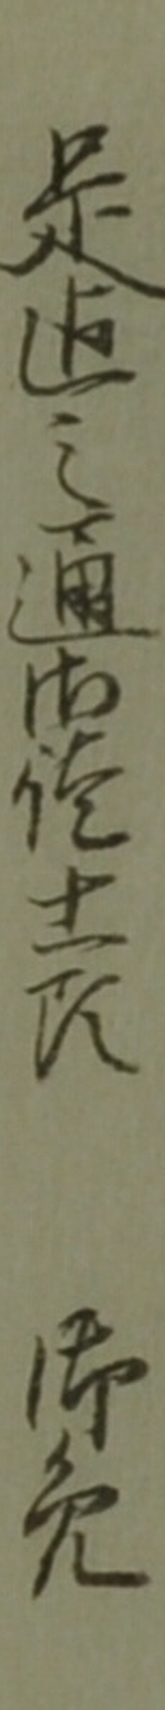是迄之通御徒士頭御免
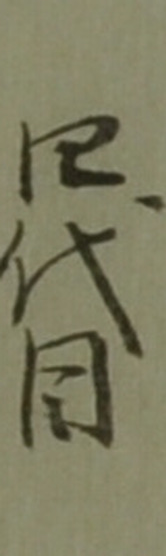四代目
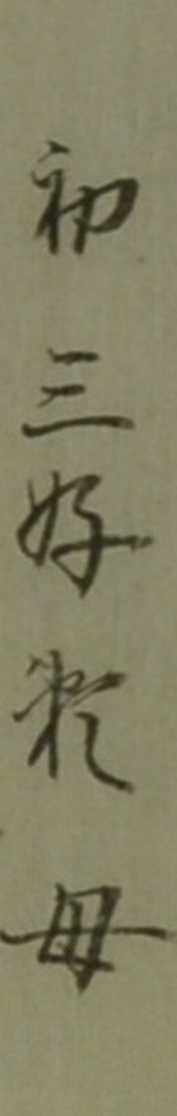初三好頼母
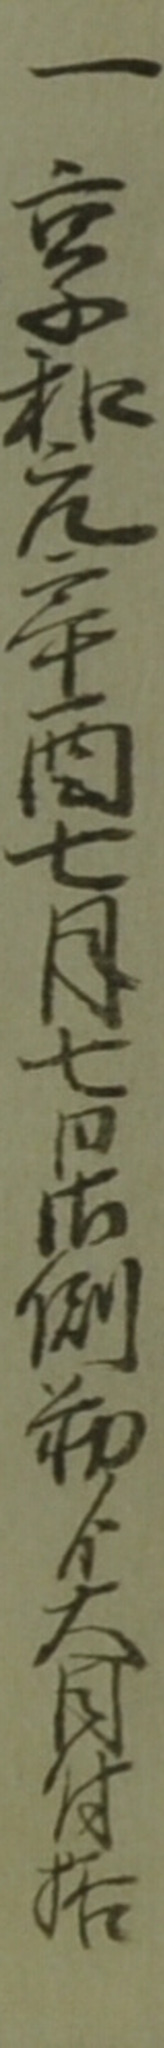一享和元辛酉七月七日御側勤ゟ大目付格
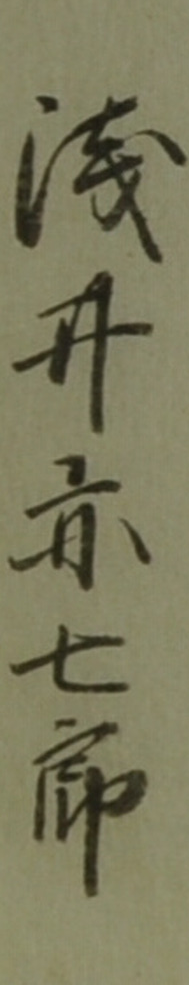浅井亦七郎
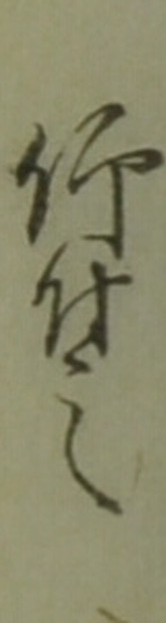仰付之
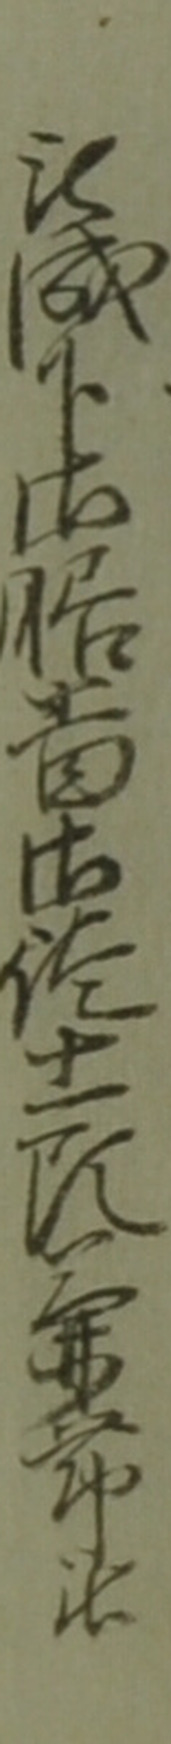被成下御膳番御徒士頭兼帯被

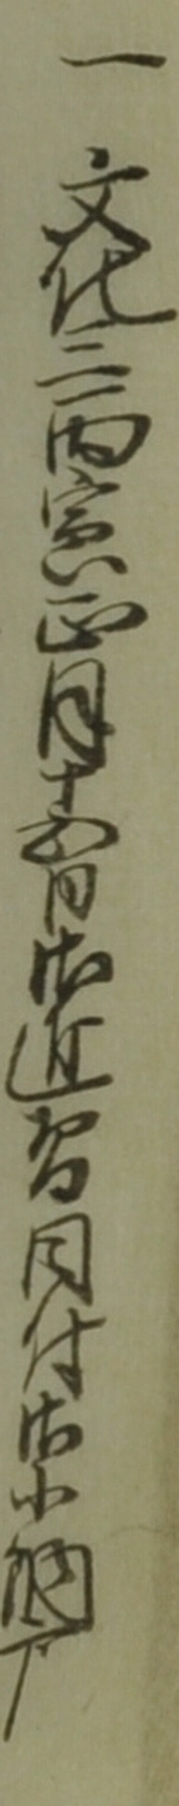一文化二丙寅正月十五日御近習目付御小納戸
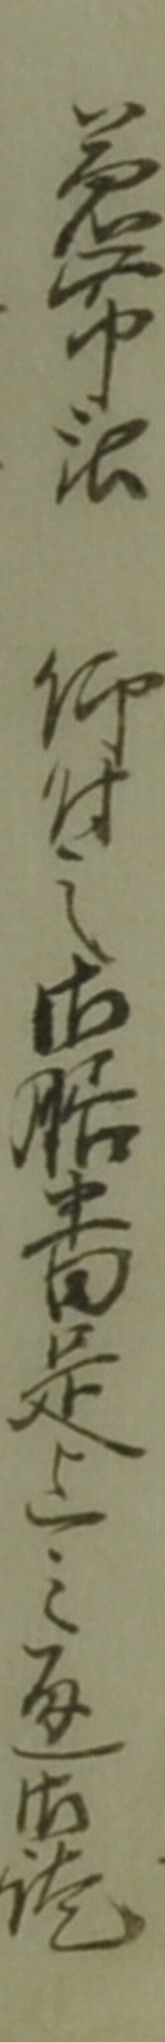兼帯被仰付之御膳番是迄之通御徒
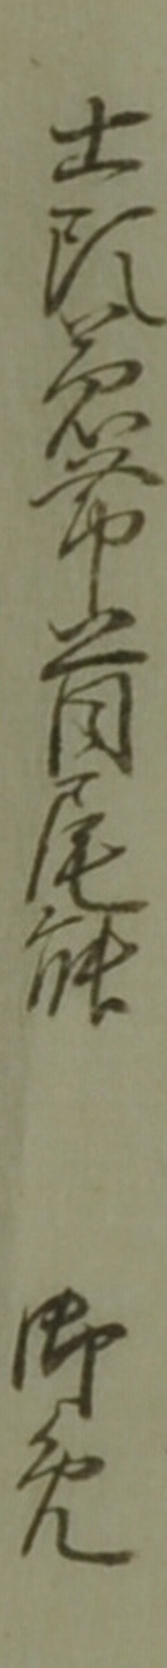士頭兼帯首尾能御免
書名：諸御役代々録（六）
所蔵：伊那市立高遠町図書館・合同会社AMANE
